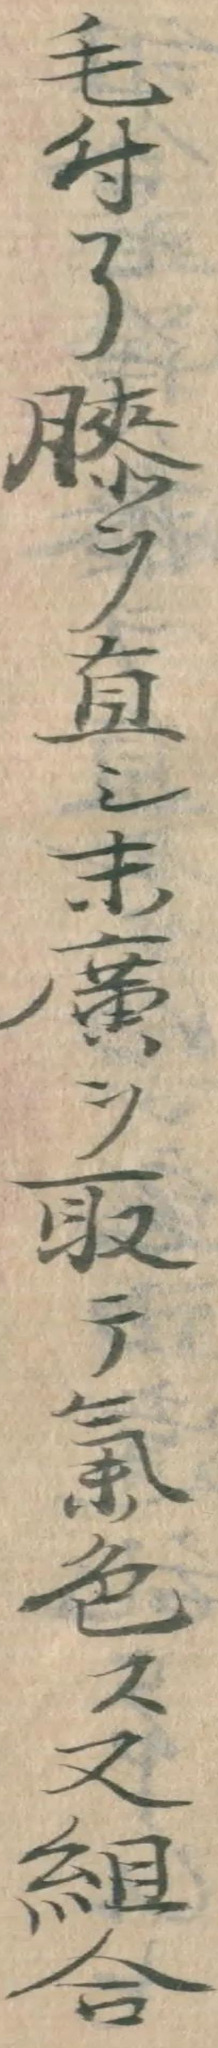毛付了膝ヲ直シ末広ヲ取テ気色ス又組合
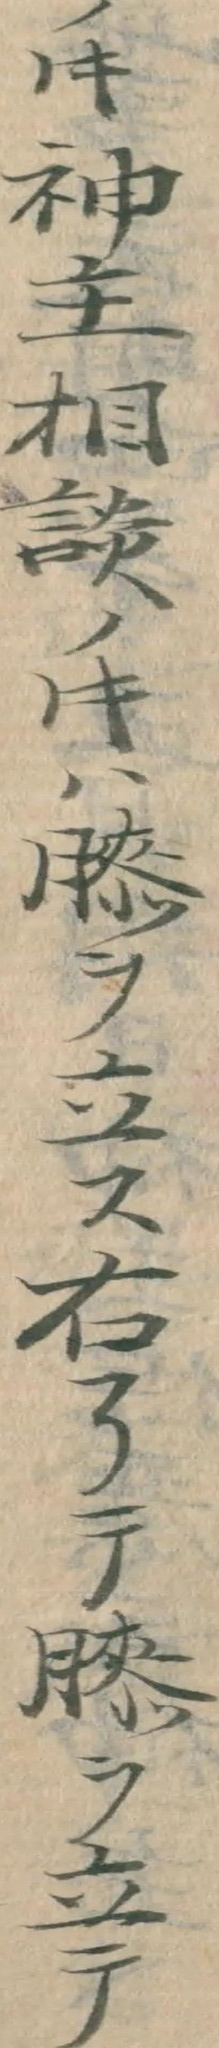ノトキ神主相談ノトキハ膝ヲ立ス右了テ膝ヲ立テ
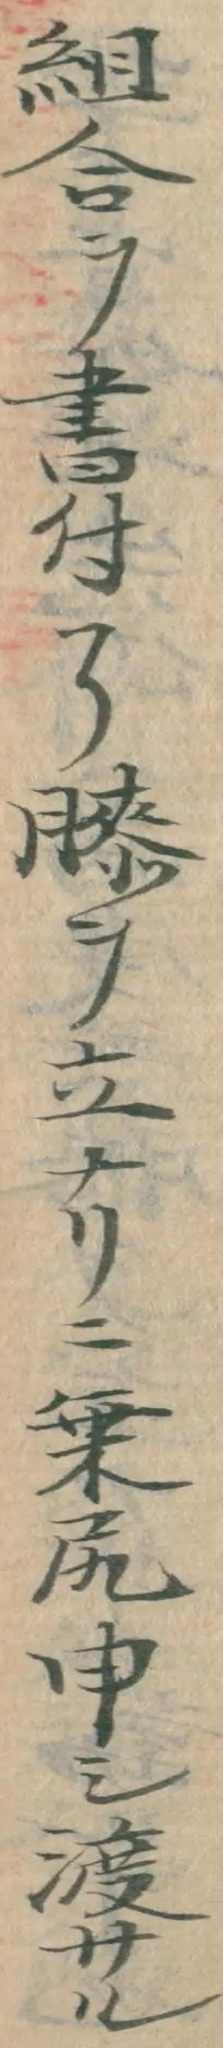組合ヲ書付了膝ヲ立ナリニ乗尻申シ渡サル

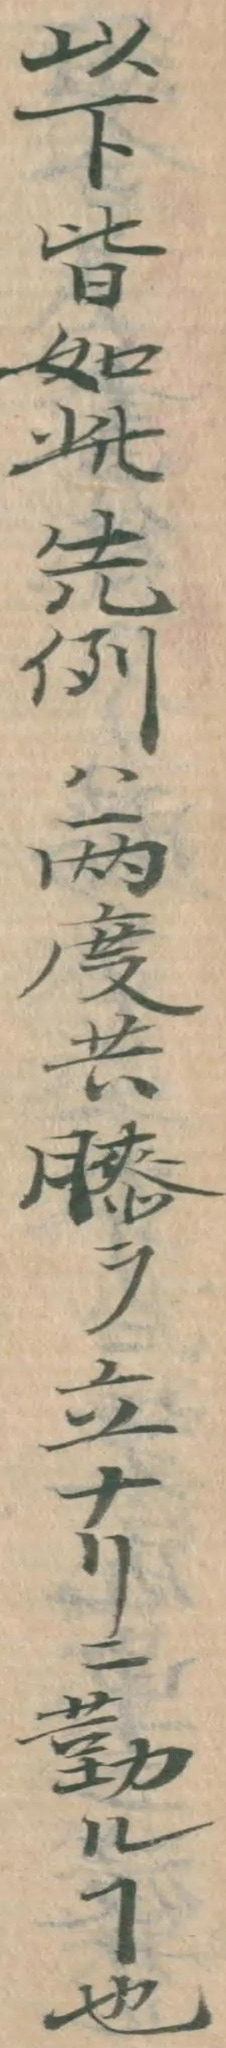以下皆如此先例ハ両度共膝ヲ立ナリニ勤ルコト也
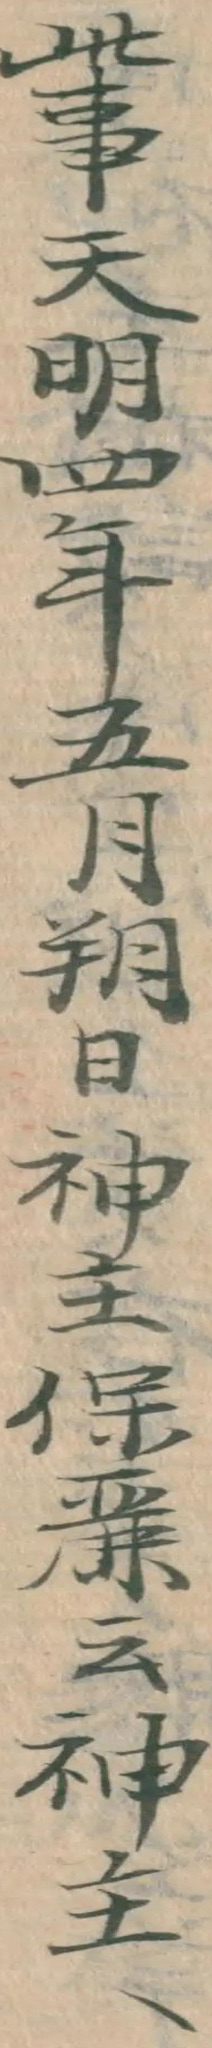此事天明四年五月朔日神主保麗云神主へ
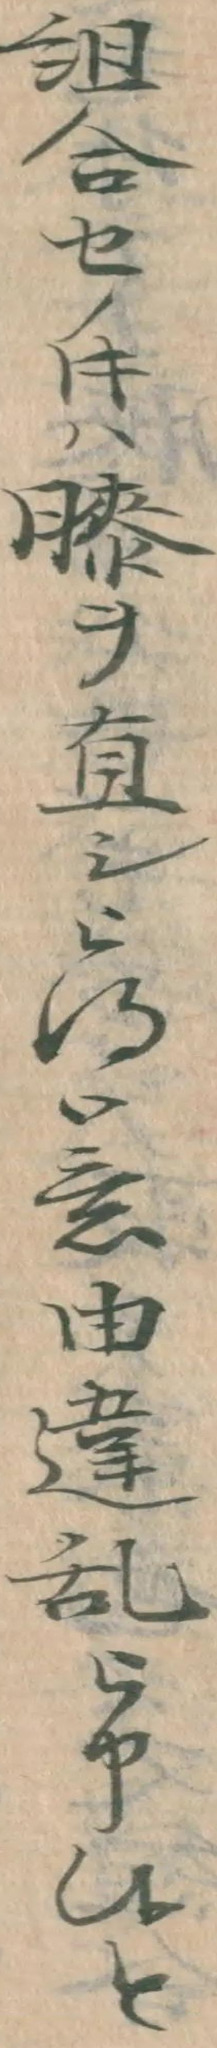組合セノトキハ膝ヲ直シ被得御意由違乱被申候と
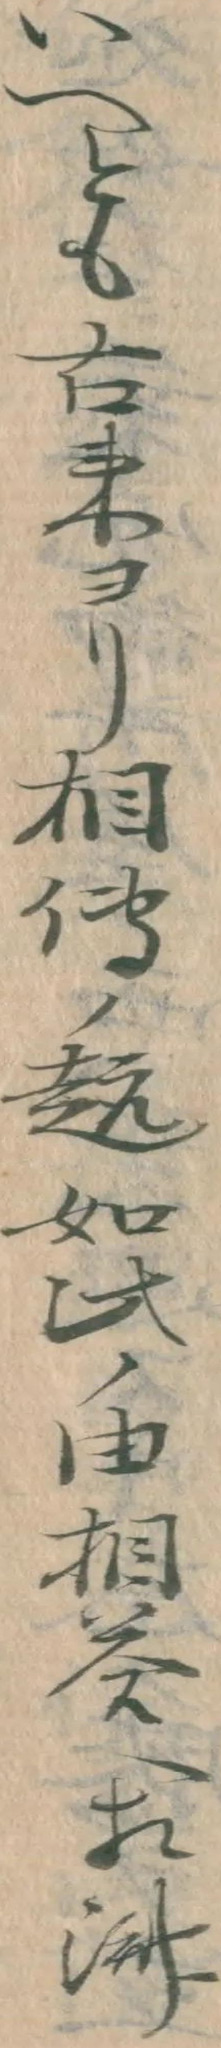いへとも古来ヨリ相伝ノ趣如此ノ由相答へ相済
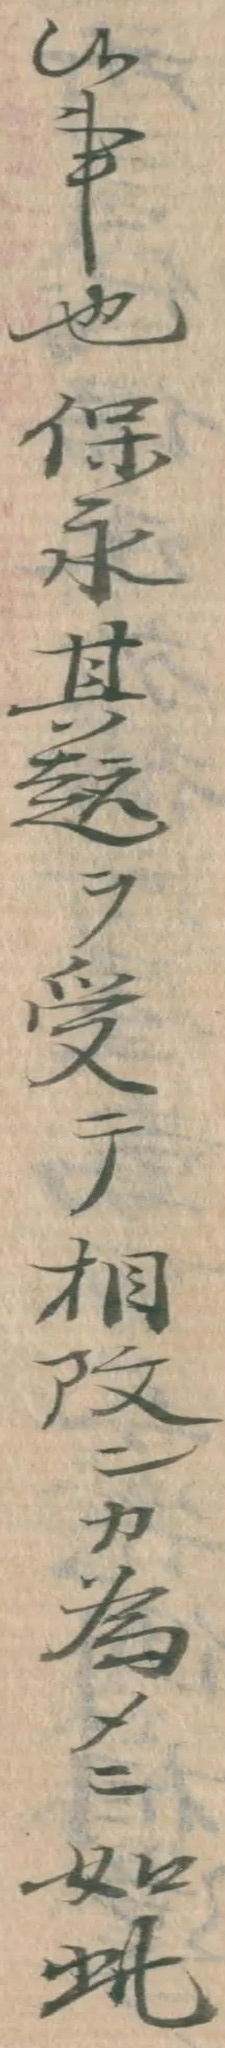候事也保永其趣ヲ受テ相改ンカ為メニ如此
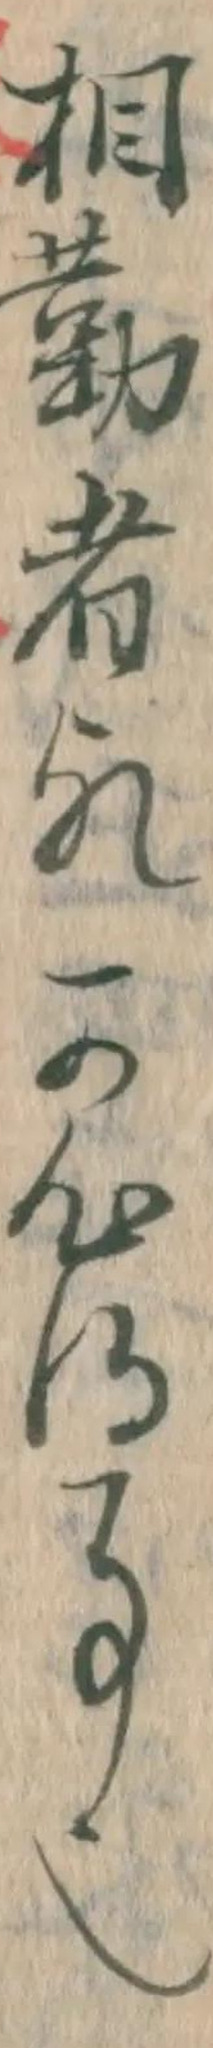相勤者歟可心得事也
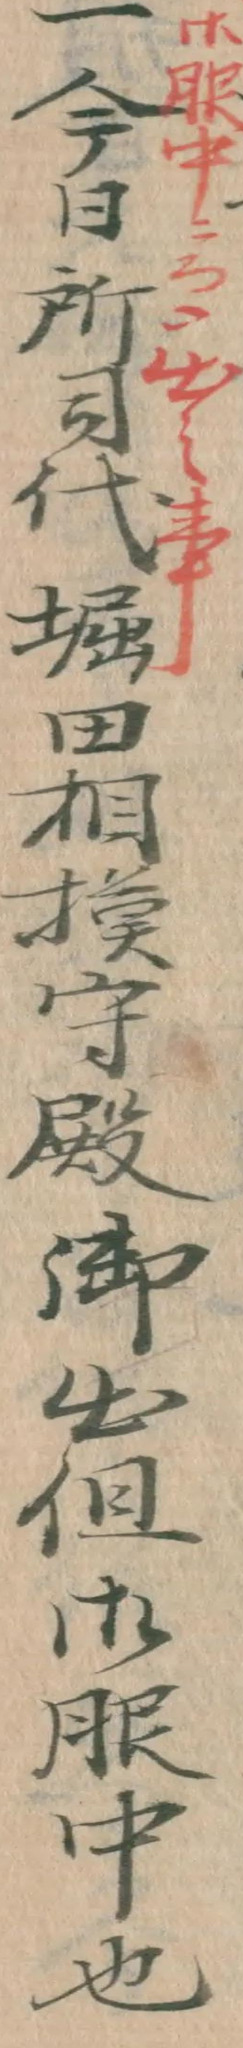一今日所司代堀田相模守殿御出但御服中也
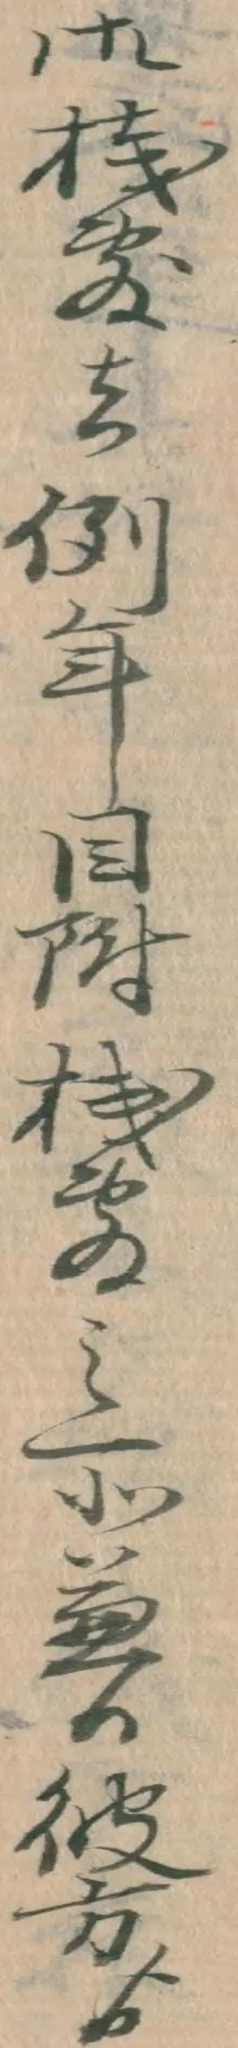御桟敷者例年目附桟敷之所兼候彼方ゟ
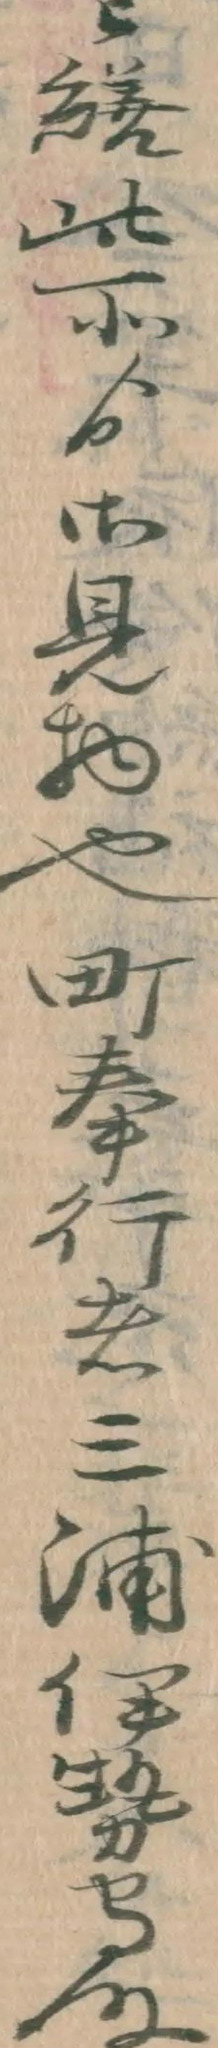被繕此所ゟ御見物也町奉行者三浦伊勢守殿
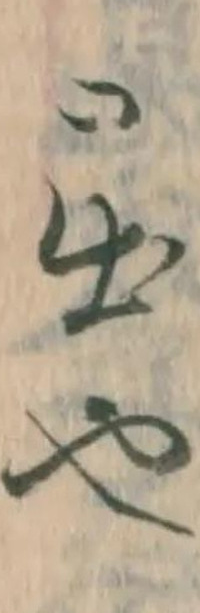御出也
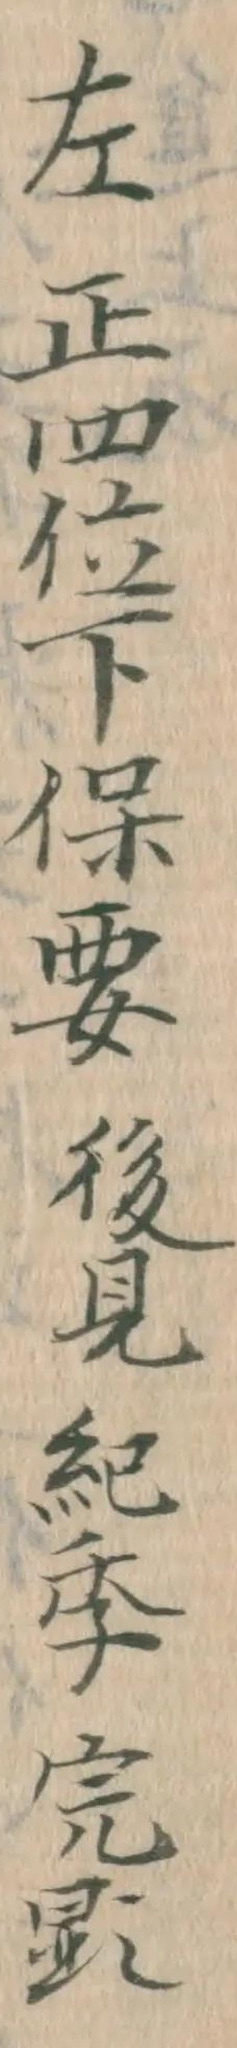左正四位下保要後見紀季完顕
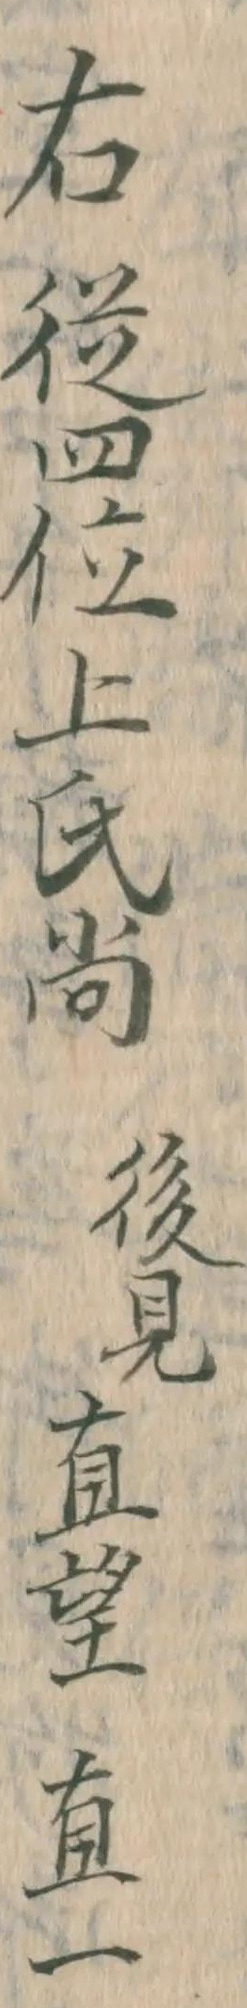右従四位上氏尚後見直望直一
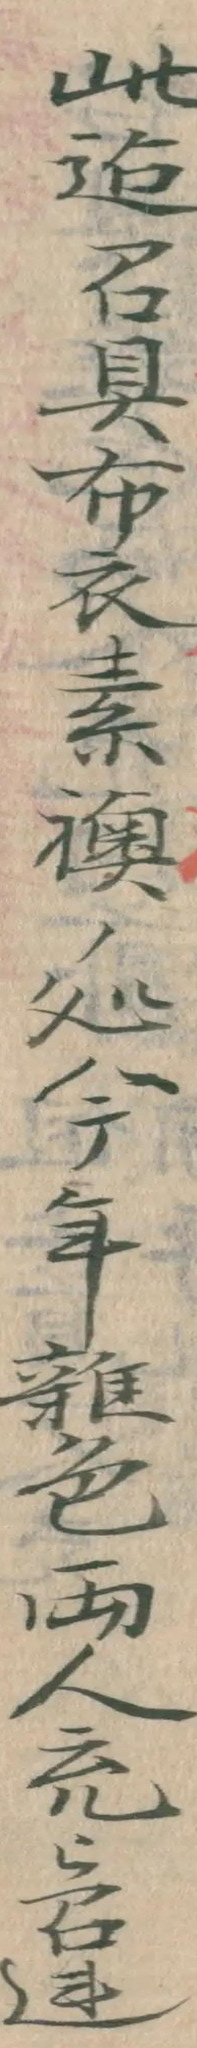此迄召具布衣素襖ノ処今年雑色両人充被召連
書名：賀茂社記録. 第10冊
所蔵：国立国会図書館 National Diet Library, JAPAN
